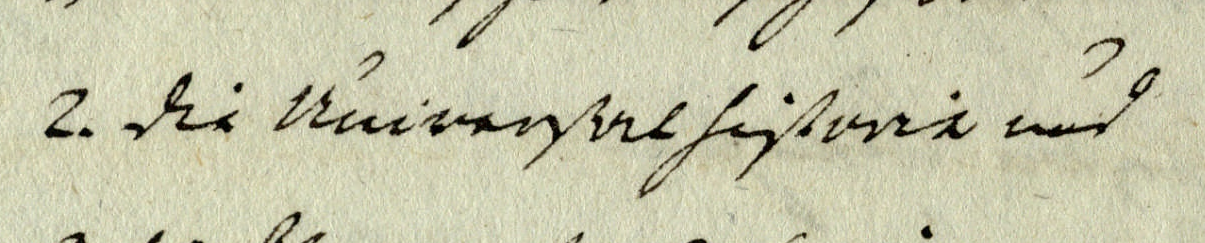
2. die Universalhistorie und
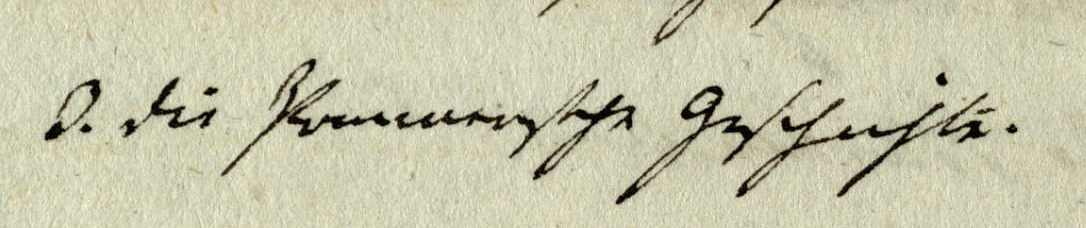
3. die Pommersche Geschichte.
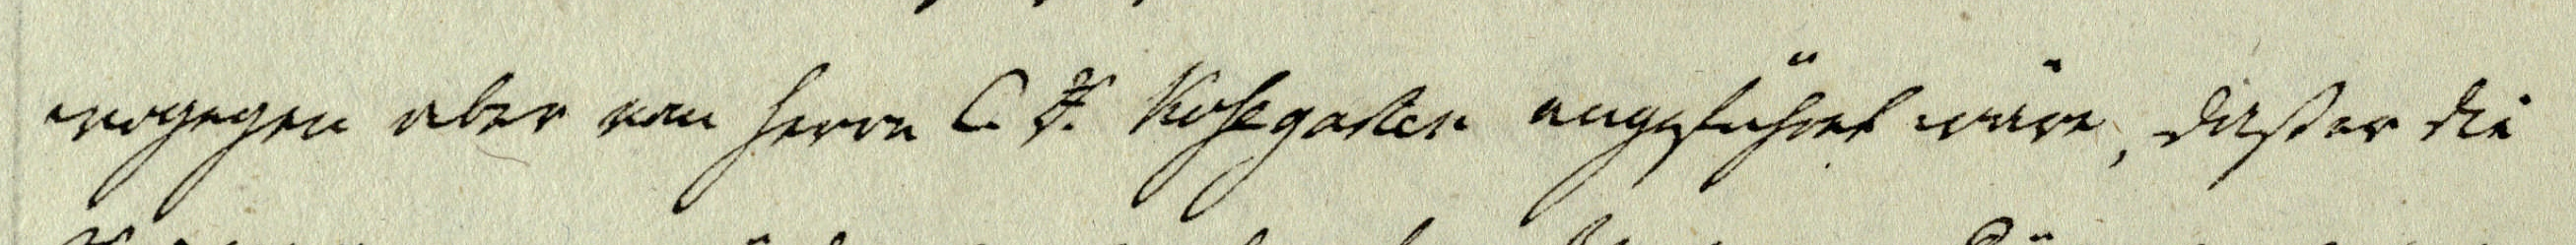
wogegen aber von Herrn C. R. Kosegarten angeführet wäre, daß er die
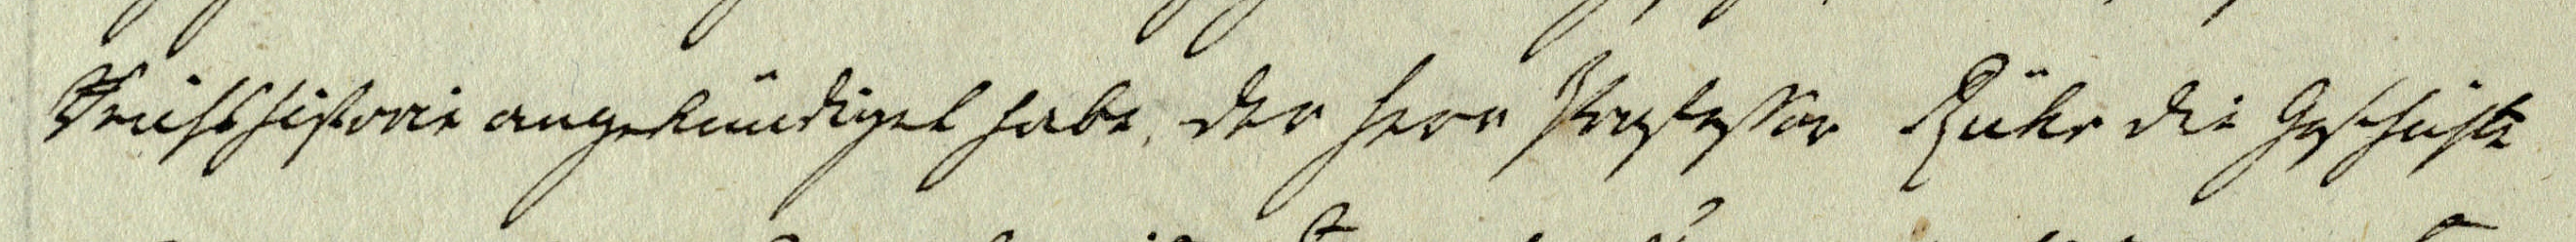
Reichshistorie angekündiget habe, der Herr Professor Rühs die Geschichte
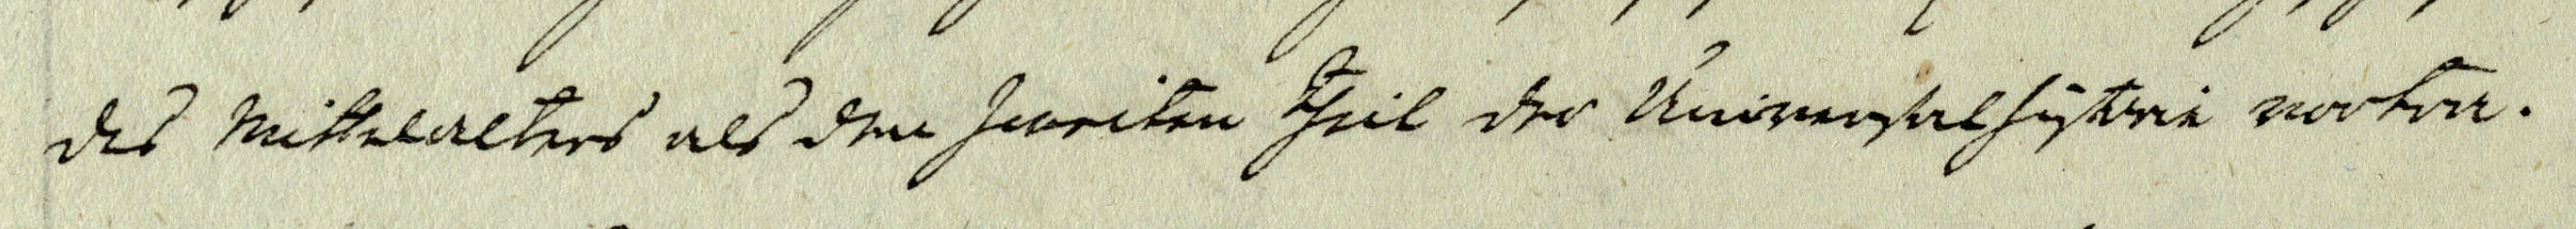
des Mittelalters als den zweiten Theil der Universalhistorie vortra¬
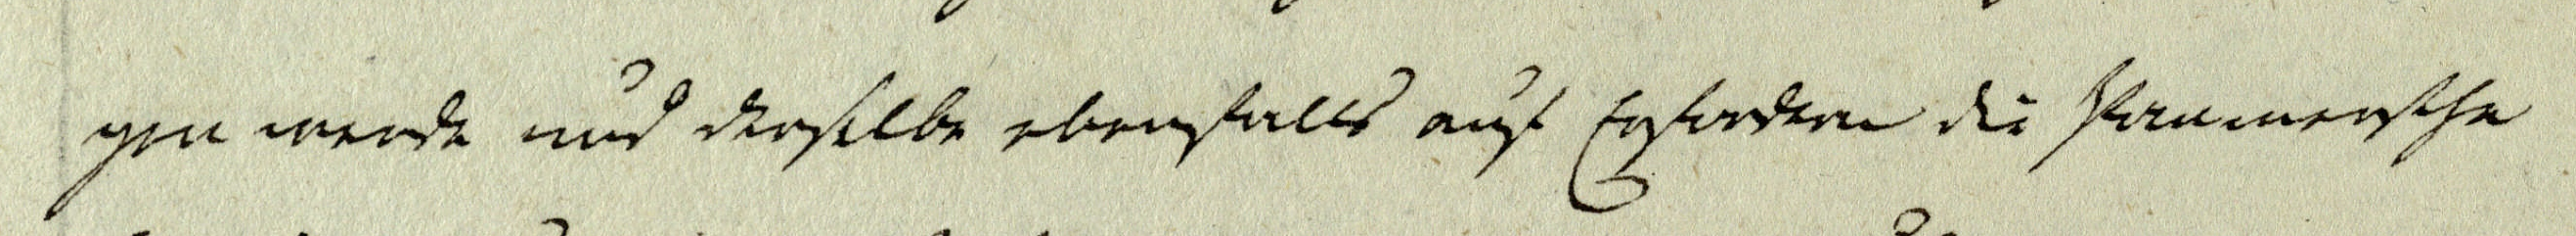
gen werde und derselbe ebenfalls auf Erfordern die Pommersche
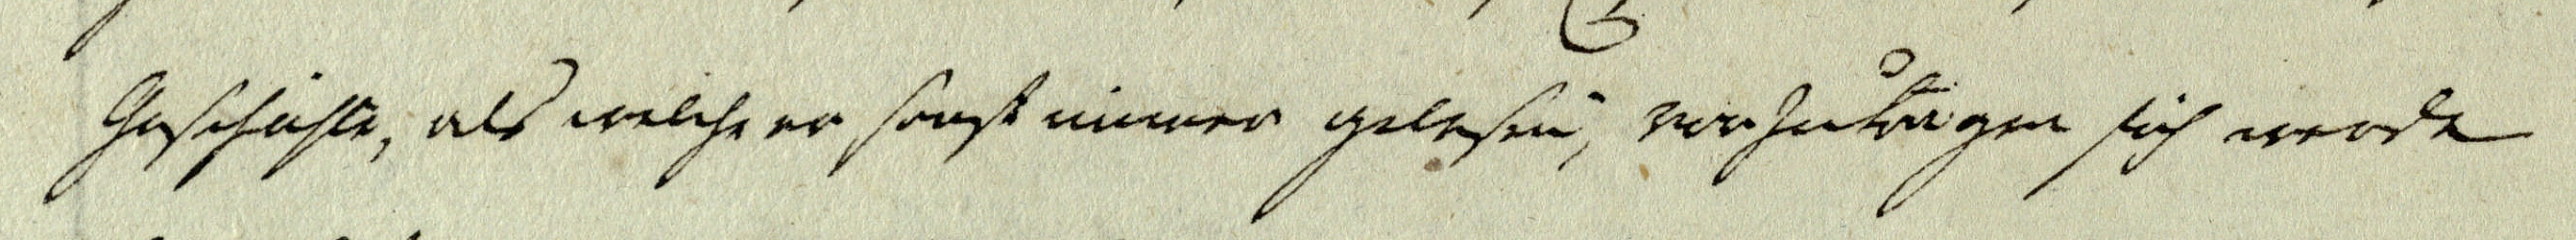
Geschichte, als welche er sonst immer gelesen, vorzutragen sich werde
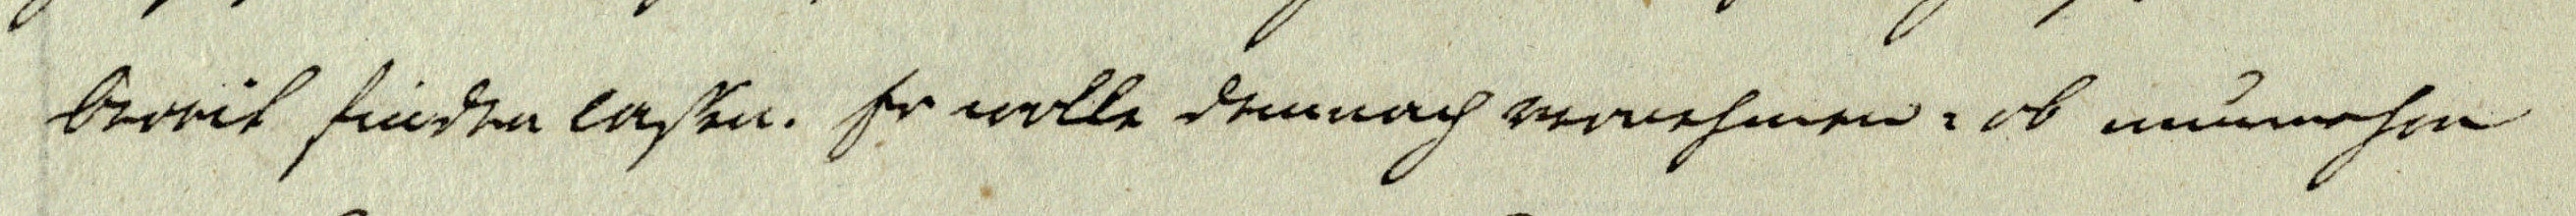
bereit finden lassen. Er wolle demnach vernehmen: ob nunmehro
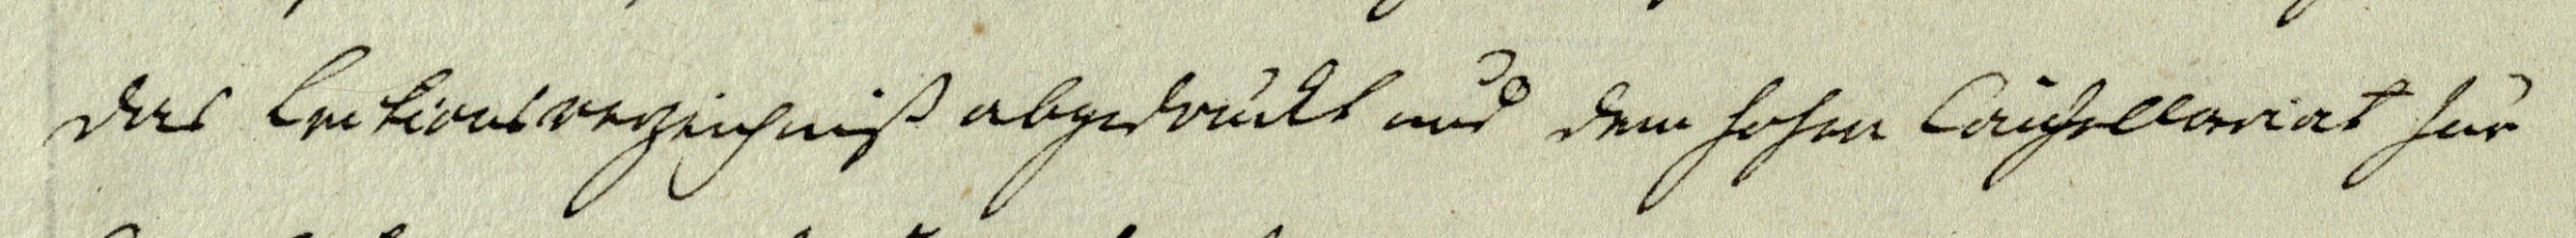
das Lectionsverzeichniß abgedruckt und dem hohen Canzellariat zur
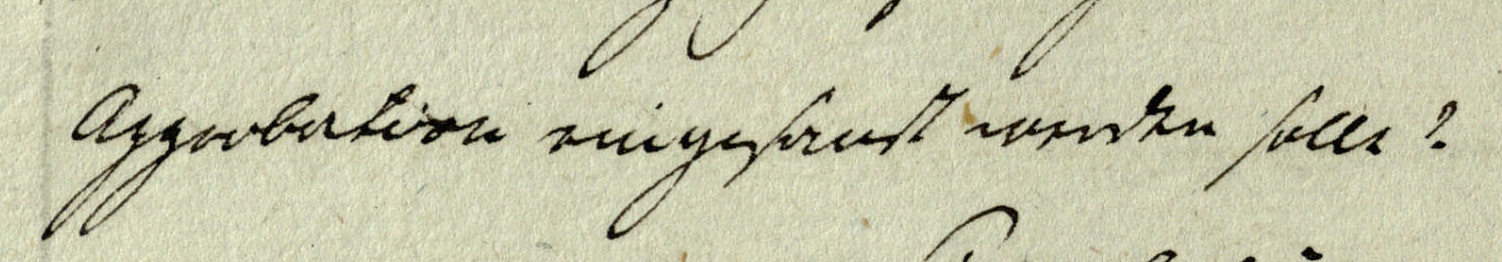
Approbation eingesandt werden solle?
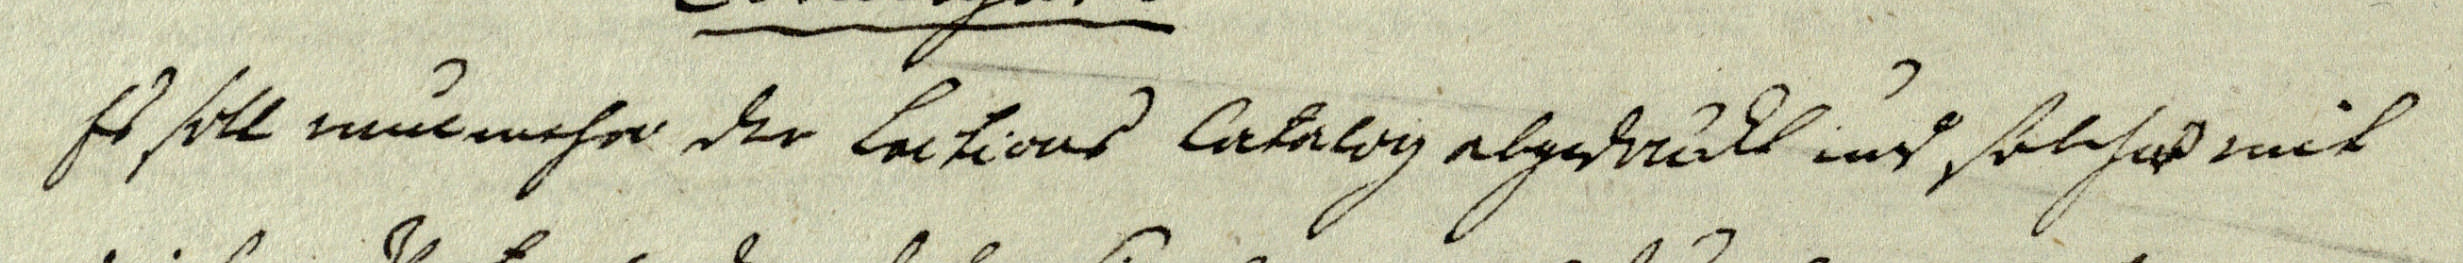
Es soll nunmehr der Lections Catalog abgedruckt und solches mit
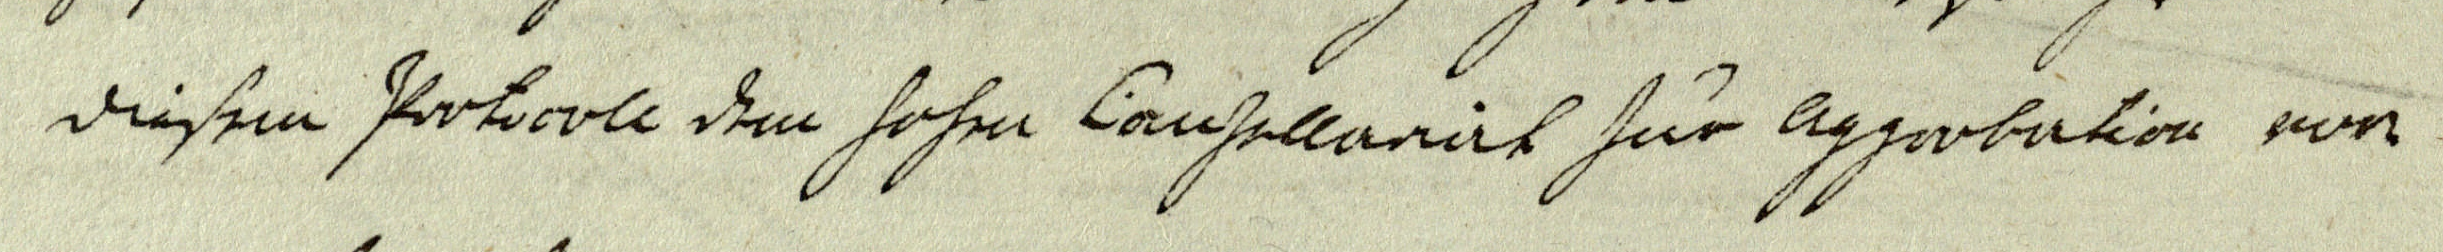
diesem Protocoll dem hohen Canzellariat zur Approbation vor¬
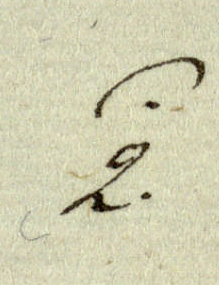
2.
